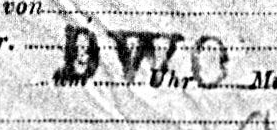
DWO
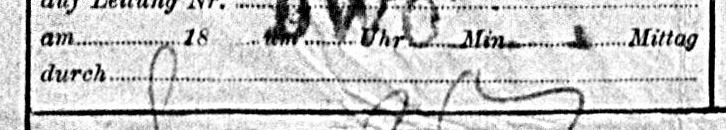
durch...
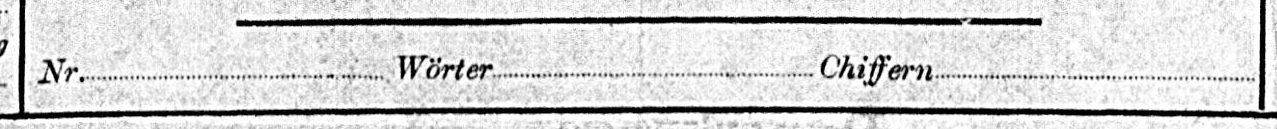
Nr. Wörter Chiffern
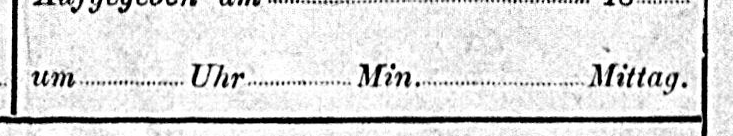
um Uhr Min. Mittag.
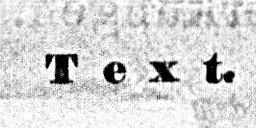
Text.
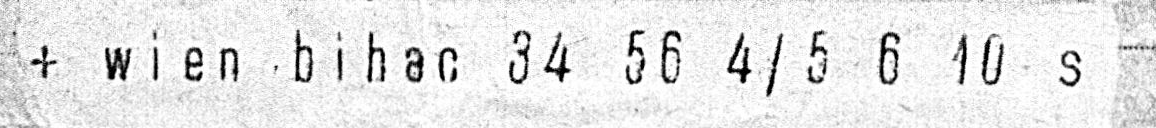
+ wien bihac 34 56 4/5 6 10 s
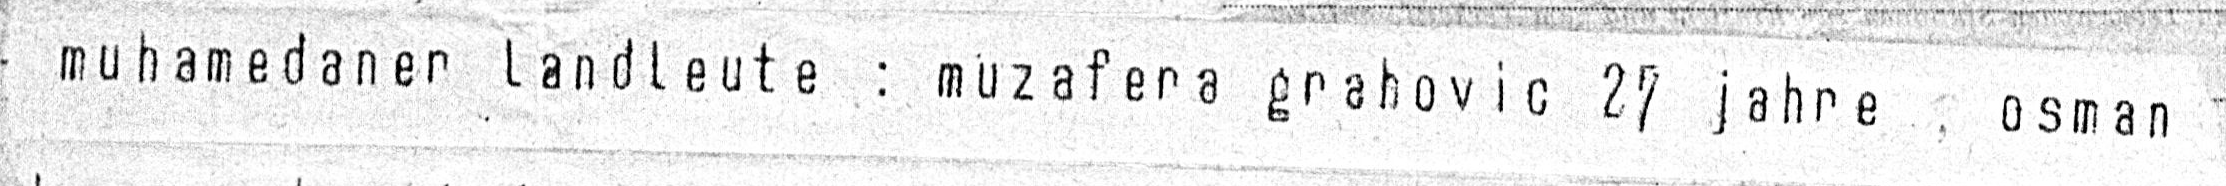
muhamedaner Landleute: muzafera grahovic 27 jahre, osman
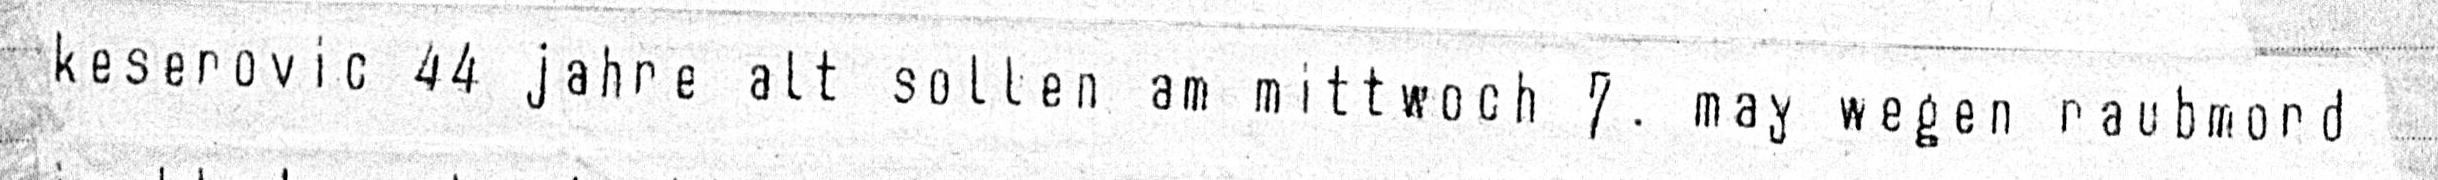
keserovic 44 jahre alt sollen am mittwoch 7. may wegen raubmord
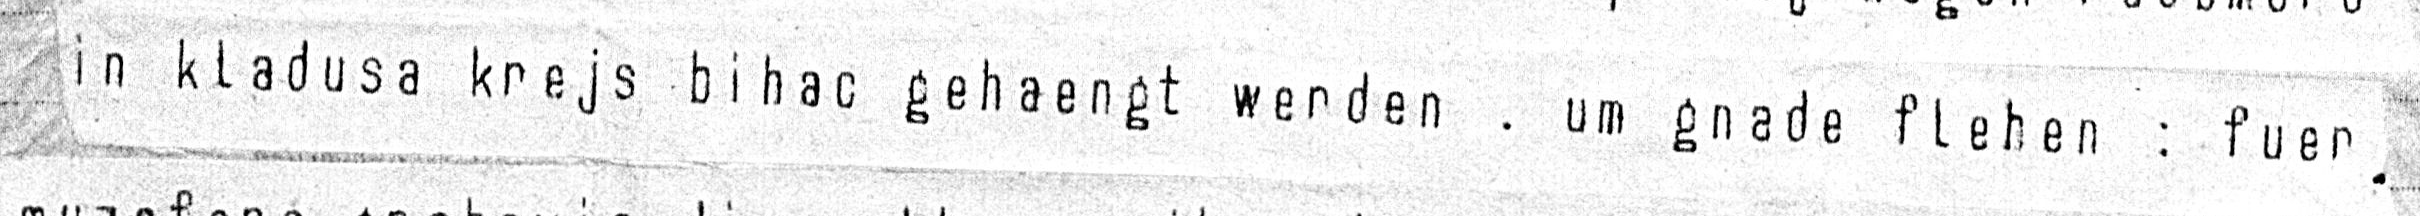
in kladusa krejs bihac gehaengt werden. um gnade flehen: fuer
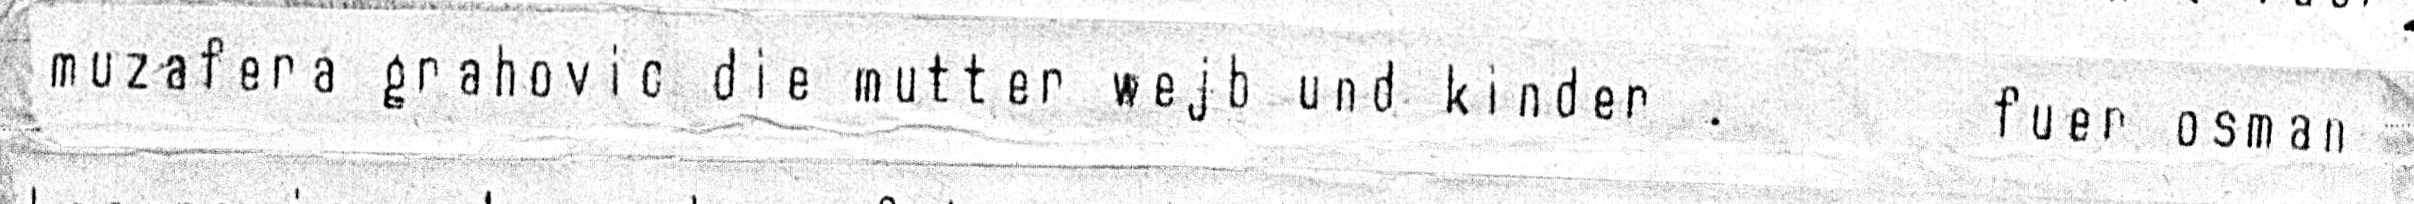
muzafera grahovic die mutter wejb und kinder. fuer osman
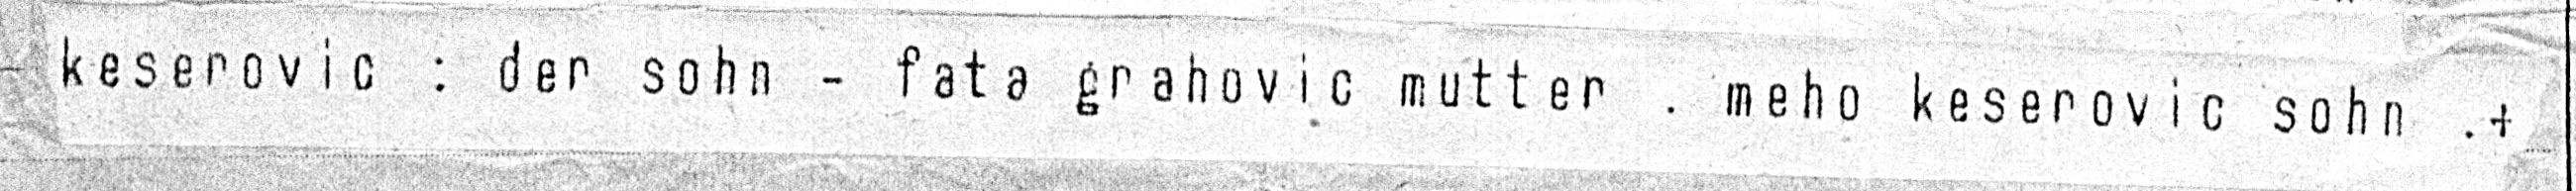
keserovic: der sohn - fata grahovic mutter. meho keserovic sohn.+
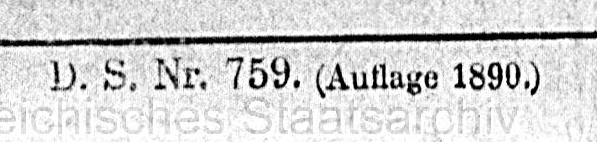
D. S. Nr. 759. (Auflage 1890.)
